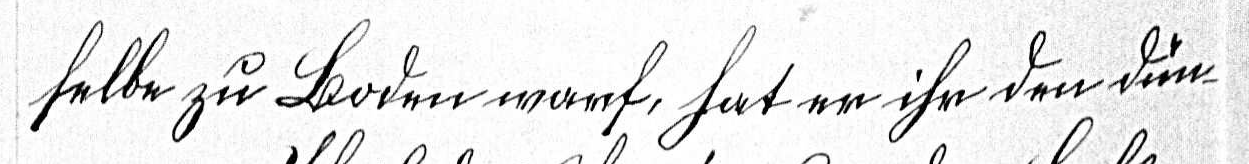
selbe zu Boden warf, hat er ihr den dün¬
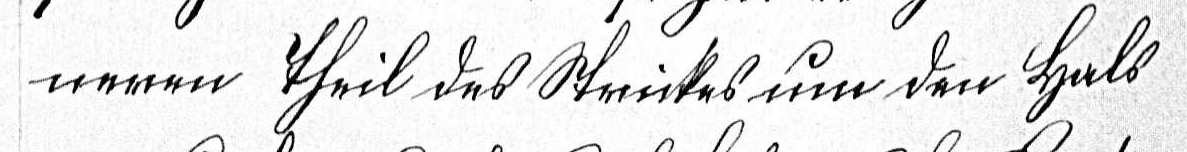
neren Theil des Strickes um den Hals
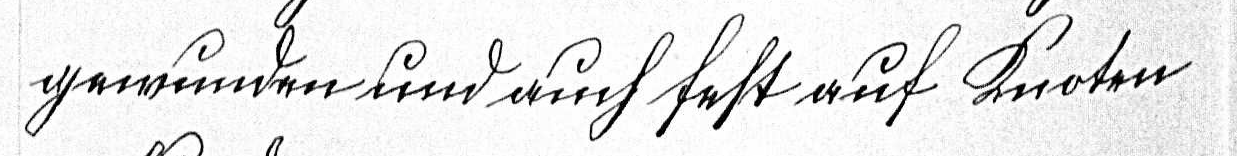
gewunden und auch fest auf Knoten
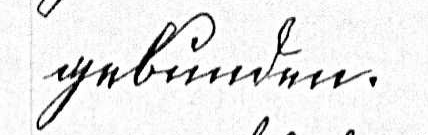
gebunden.
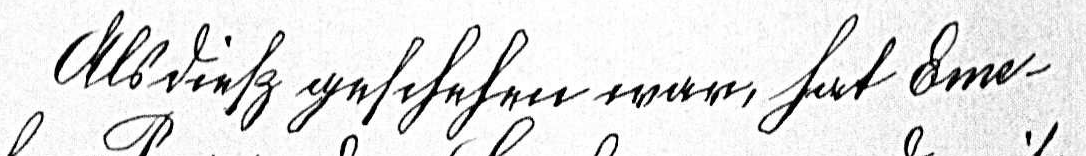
Als dieß geschehen war, hat Eme¬
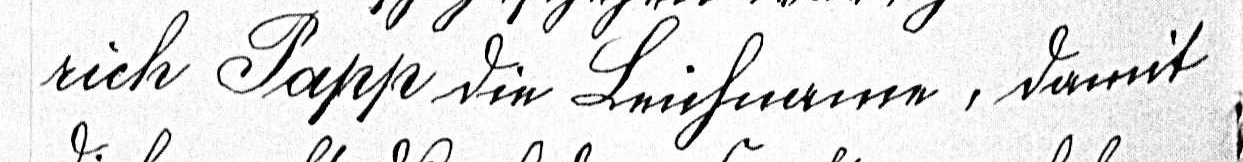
rich Papp die Leichname, damit
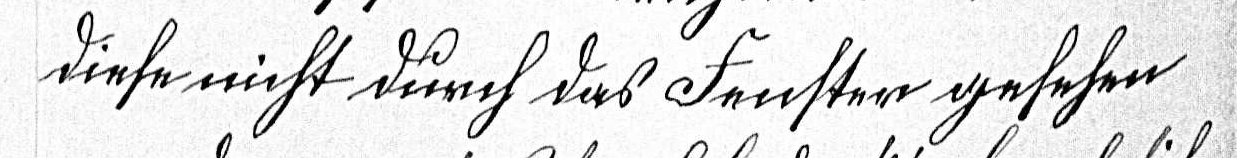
diese nicht durch das Fenster gesehen
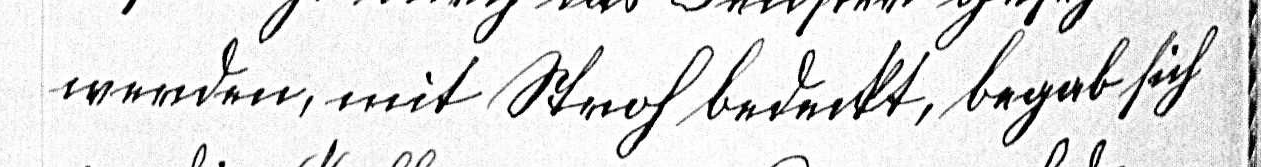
werden, mit Stroh bedeckt, begab sich
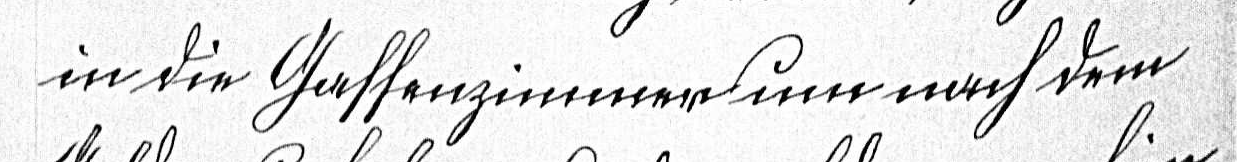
in die Gassenzimmer um nach dem
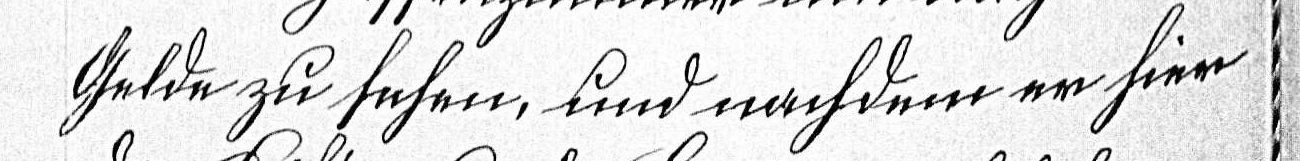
Gelde zu sehen, und nachdem er hier
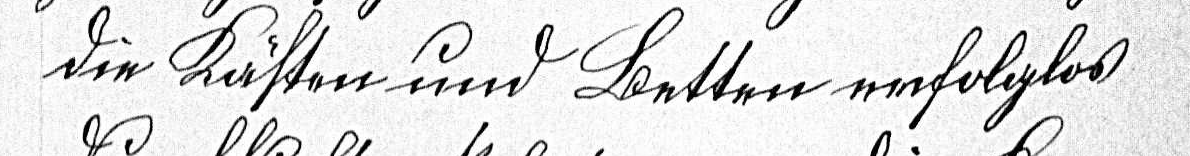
die Kästen und Betten erfolglos
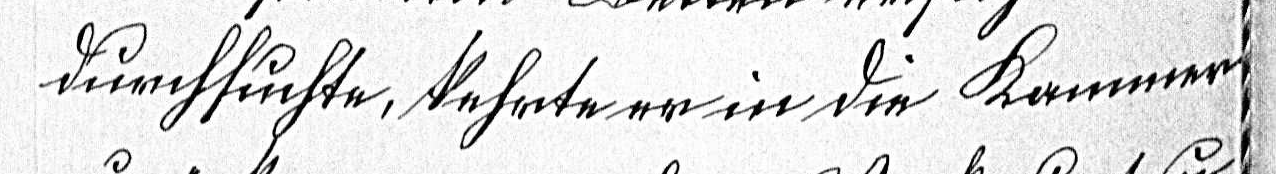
durchsuchte, kehrte er in die Kammer
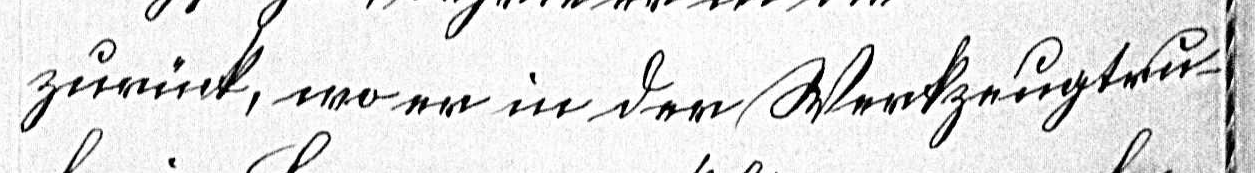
zurück, wo er in der Werkzeugtru¬
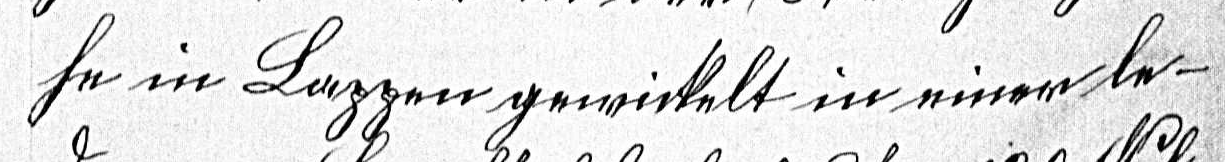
he in Lappen gewickelt in einer le¬
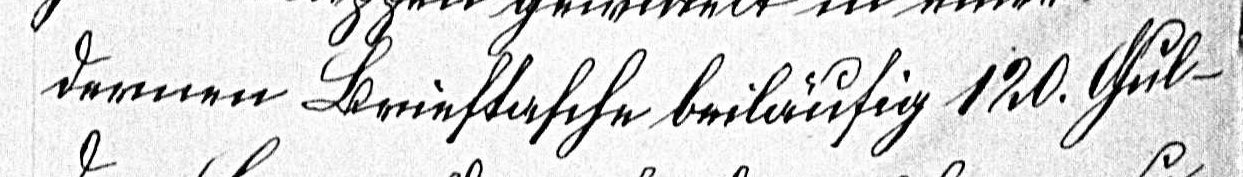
dernen Brieftasche beiläufig 120. Gul¬
